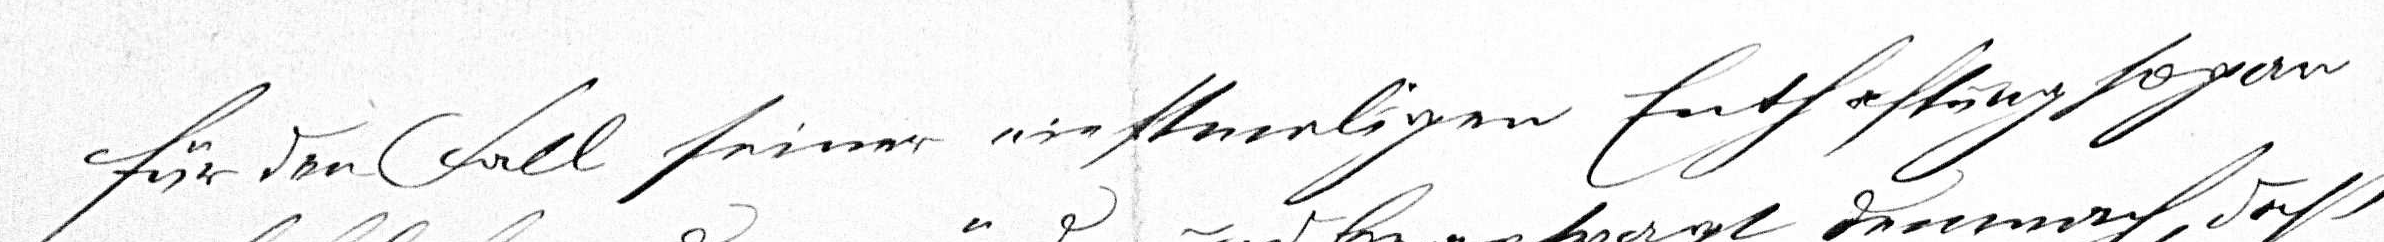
für den Fall seiner einstmaligen Enthaftung sogar
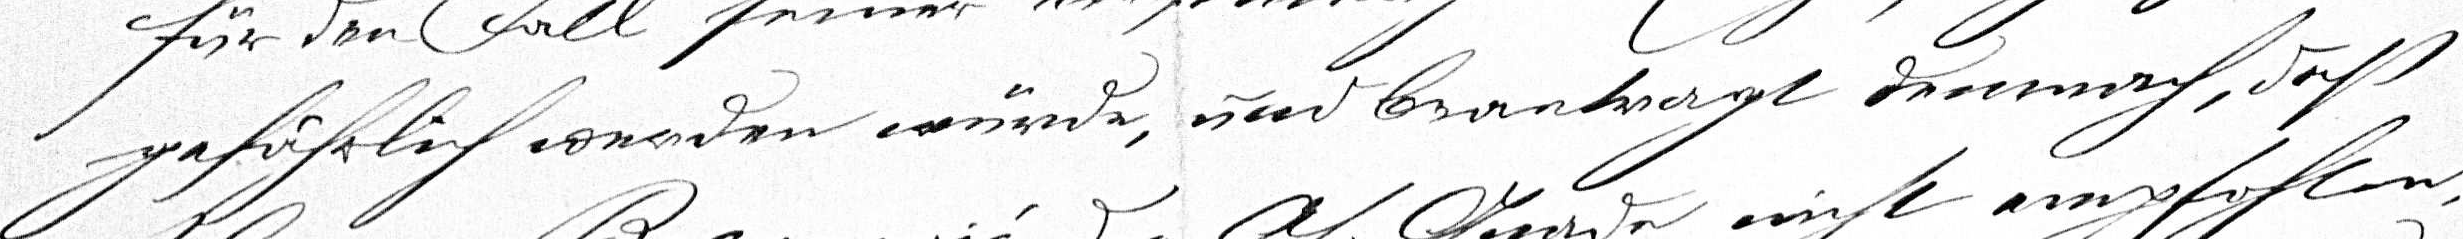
gefährlich wreden wurde, und beantragt demnach, daß
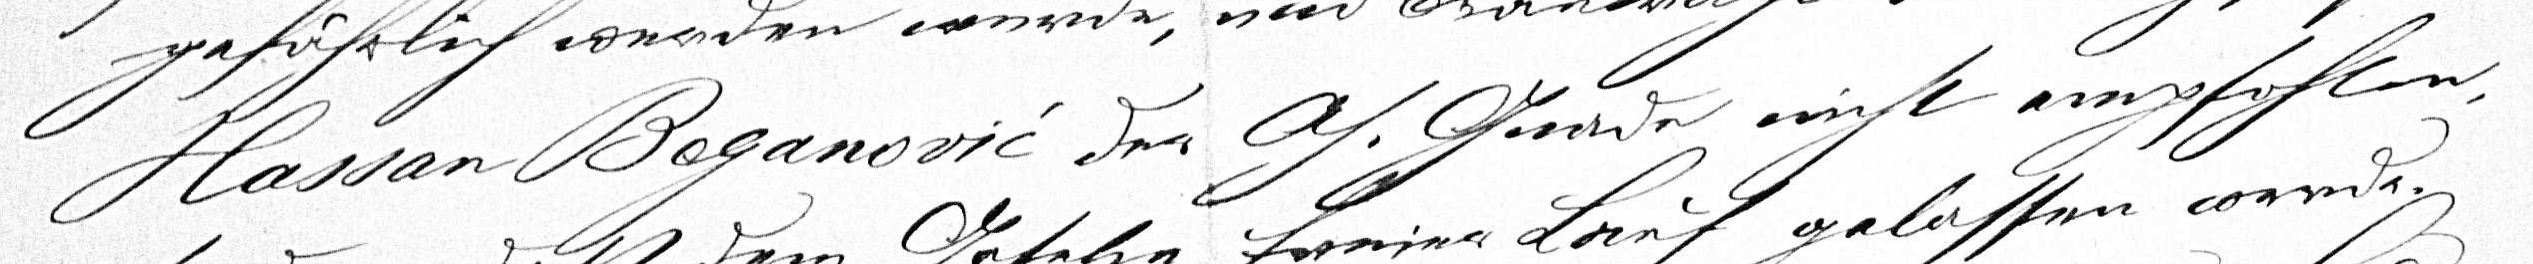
Hassan Beganović der Ah. Gnade nicht empfohlen,
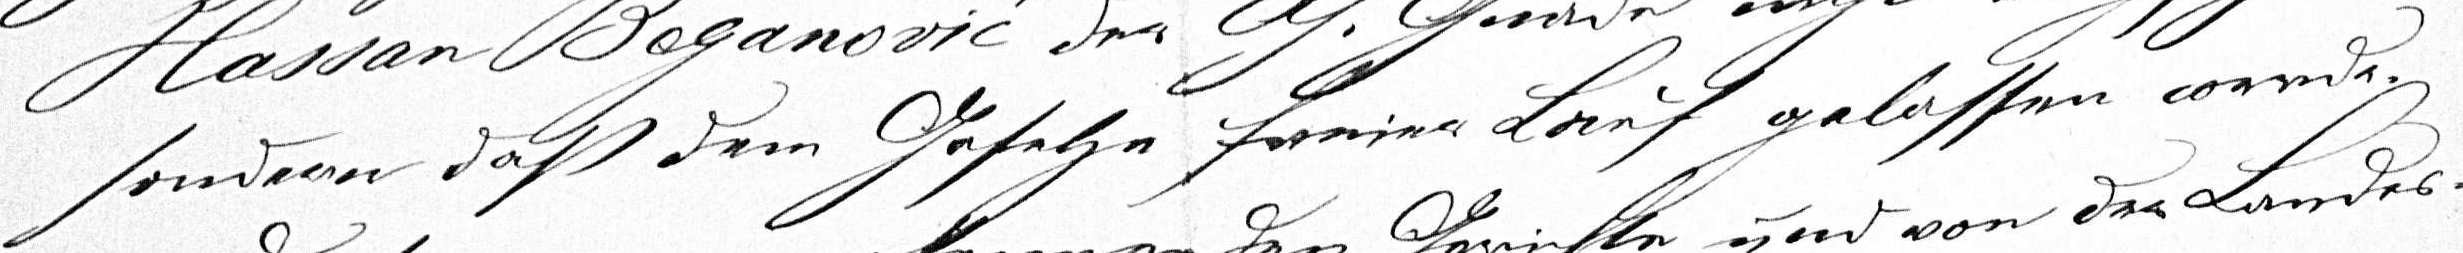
sondern daß dem Gesetze freier Lauf gelassen werde.
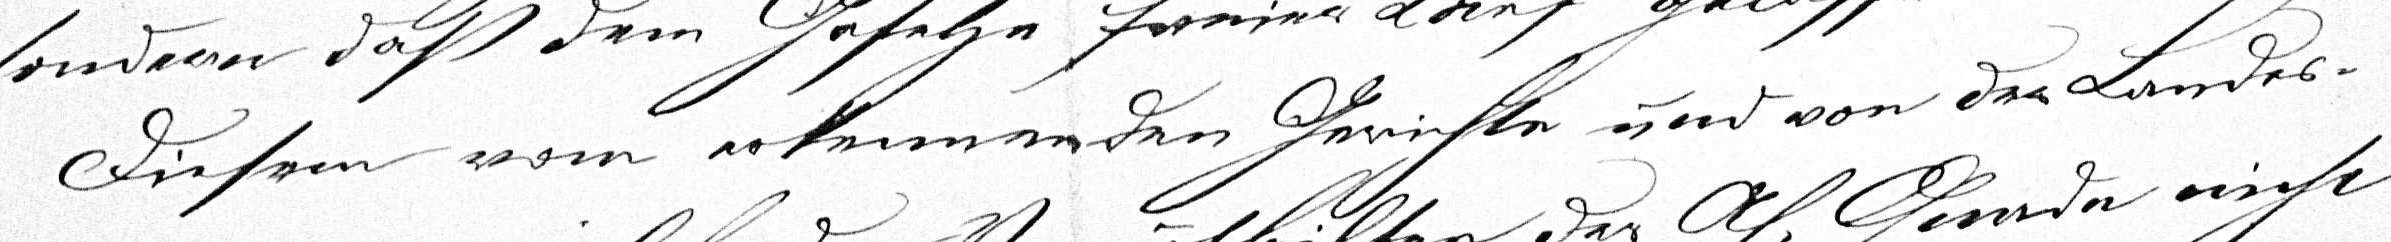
Diesem vom erkennenden Gerichte und von der Landes¬
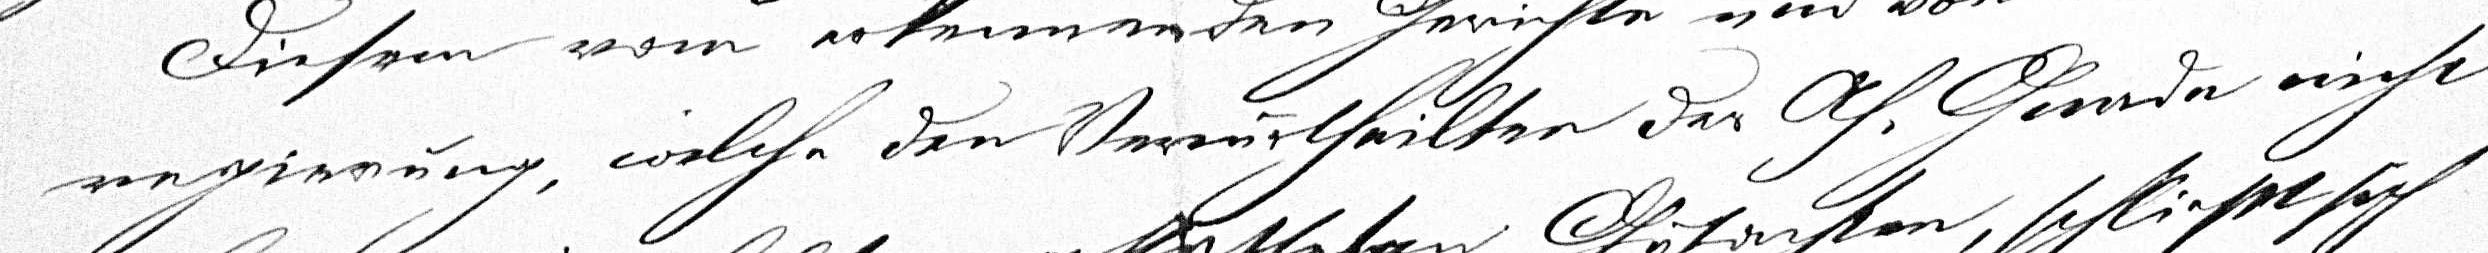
regierung, welche den Verurtheilten der Ah. Gnade nicht
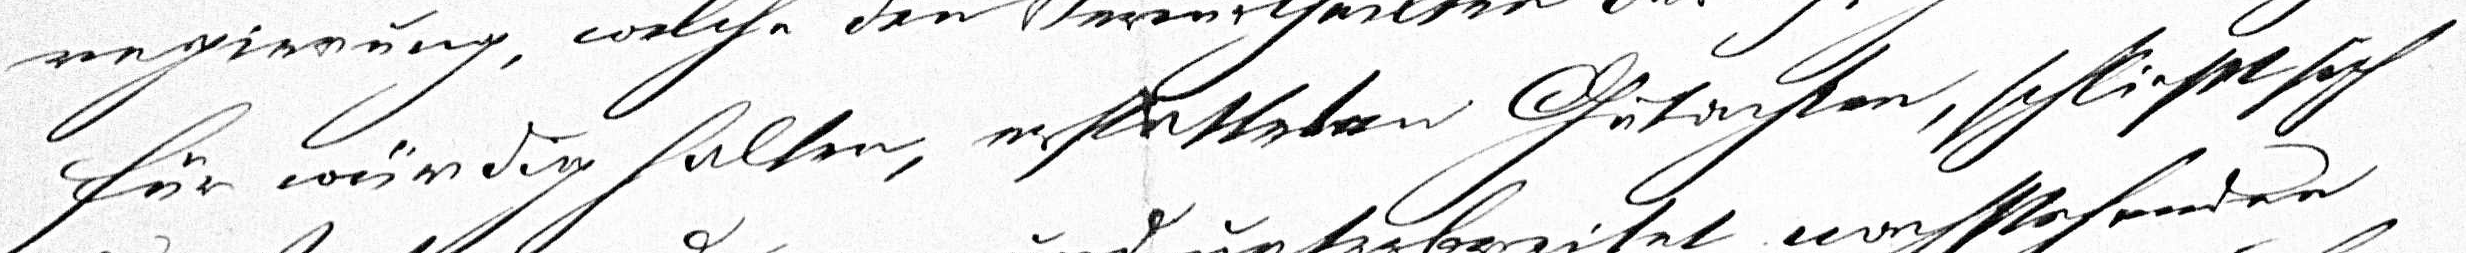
für würdig halten, erstatteten Gutachten, schlißtlich
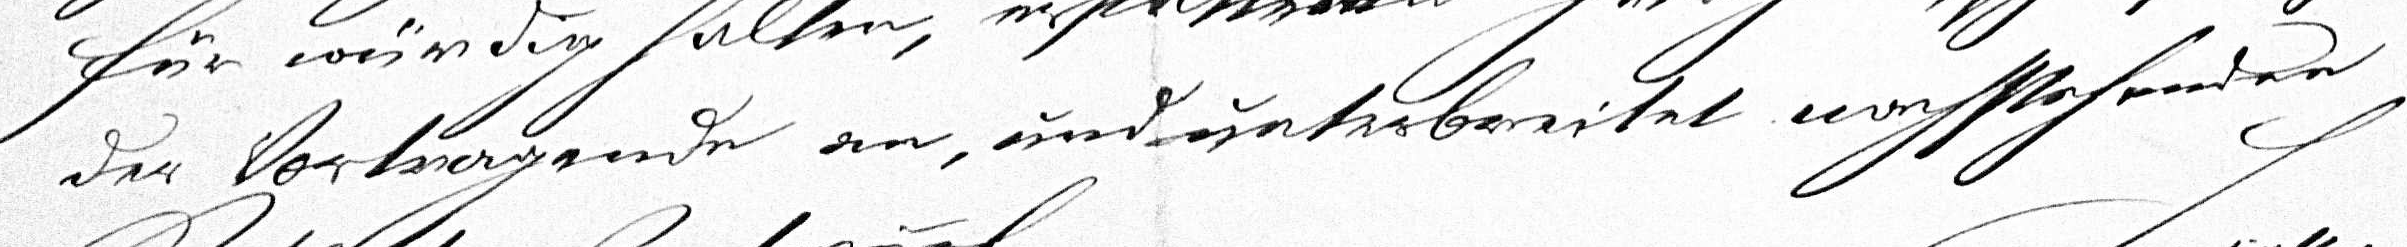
der Vortragende an, und unterbreitet nachstehenden
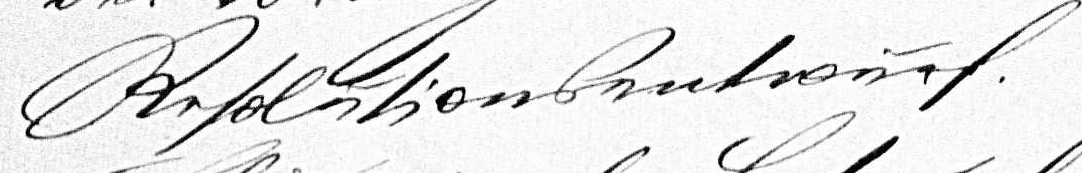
Resolutionsentwurf.
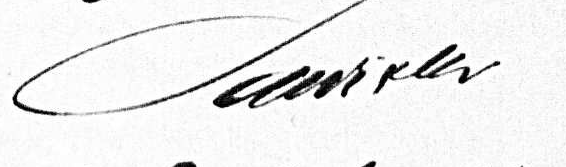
Sawicki
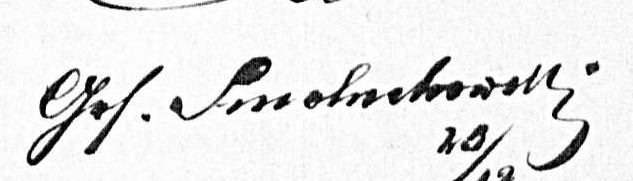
Ges. Smolnchowcki
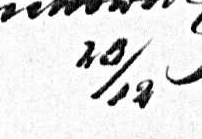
2xx/12
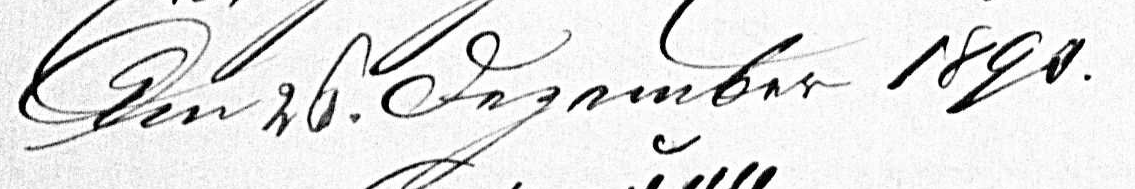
Am 26. Dezember 1890.
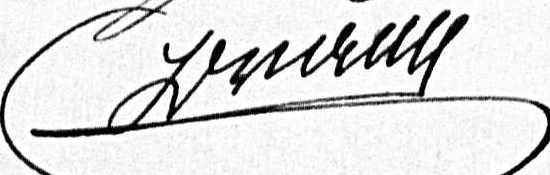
Braun
